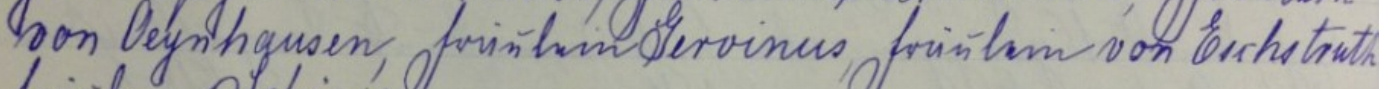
von Oeynhausen, Fräulein Servinus, Fräulein von Eschstruth,
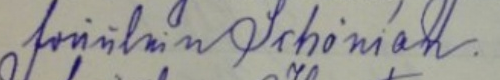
Fräulein Schönian
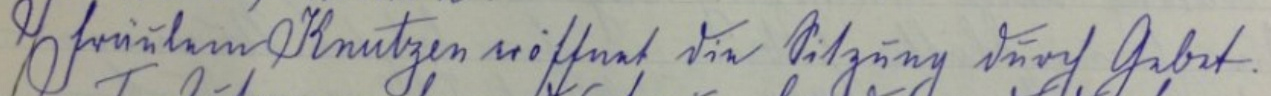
Fräulein Knutzen eröffnet die Sitzung durch Gebet.
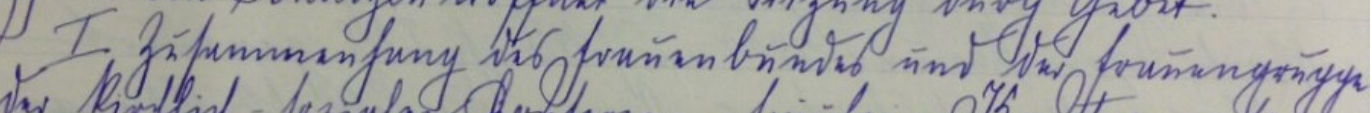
I. Zusammenhang des Frauenbundes und der Frauengruppe
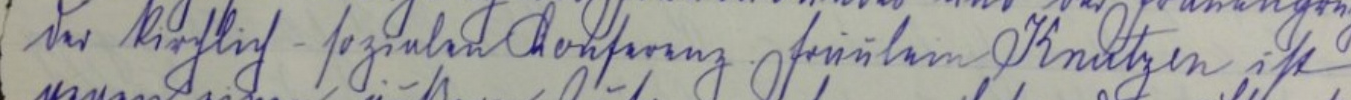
der kirchlich-sozialen Konferenz. Fräulein Knutzen ist
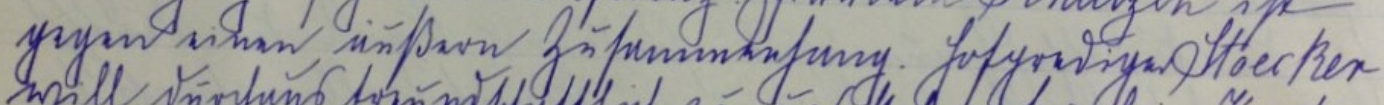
gegen einen äußern Zusammenhang. Hofprediger Stoecker
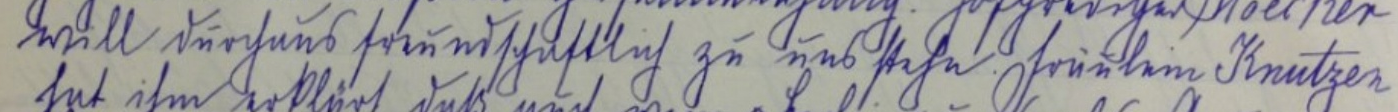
will durchaus freundschaftlich zu uns stehen. Fräulein Knutzen
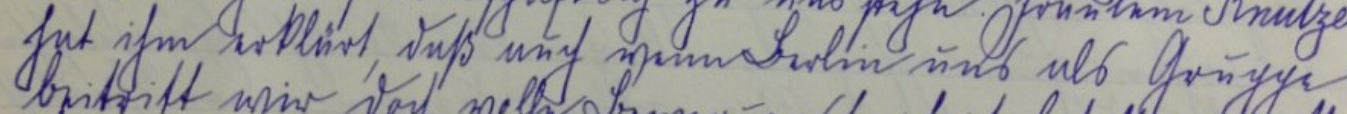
hat ihm erklärt, daß auch wenn Berlin uns als Gruppe
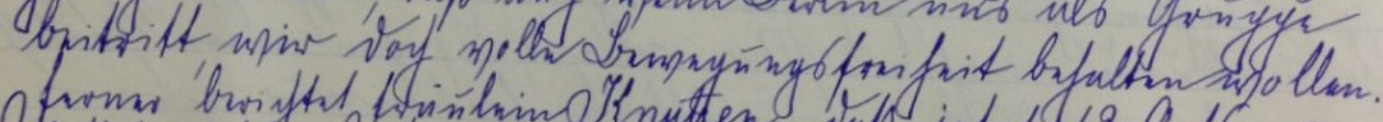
beitritt, wir doch volle Bewegungsfreiheit behalten wollen.
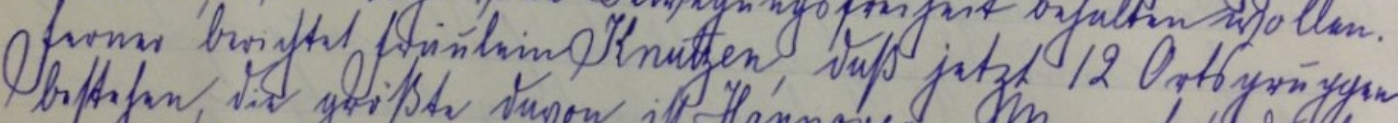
Ferner berichtet Fräulein Knutzen, daß jetzt 12 Ortsgruppen bestehen,
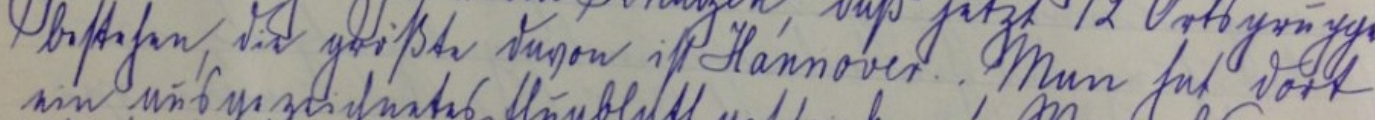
die größte davon in Hannover. Man hat dort
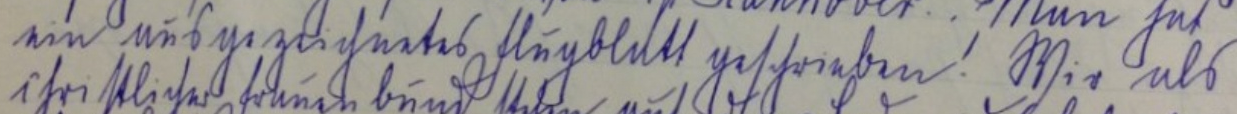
ein ausgezeichnetes Flugblatt geschrieben! Wir als
